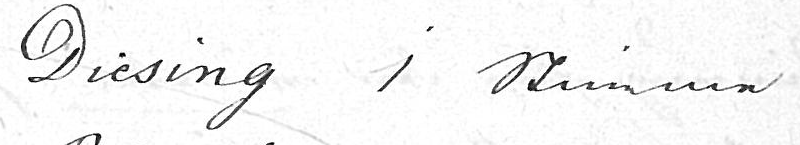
Diesing 1 Stimme
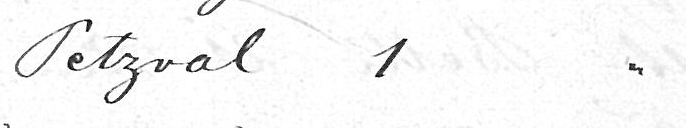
Petzval 1 "
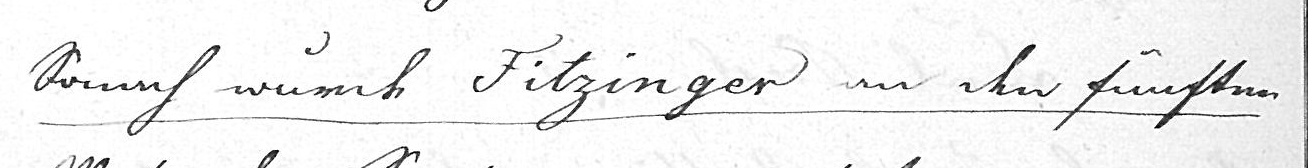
Sonach wurde Fitzinger an den fünften
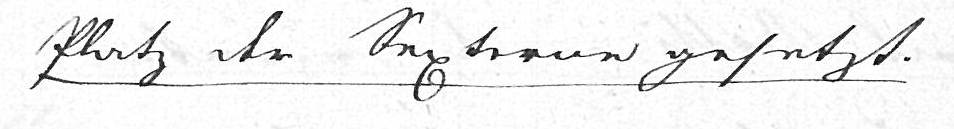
Platz der Sexterne gesetzt.
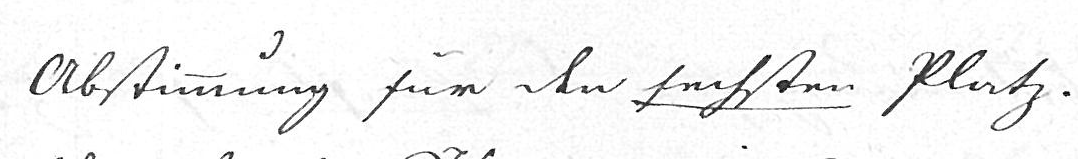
Abstimmung für den sechsten Platz.
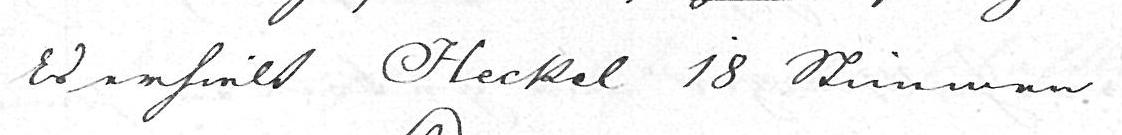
Es erhielt Heckel 18 Stimmen
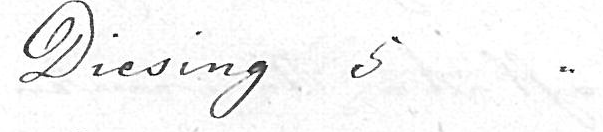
Diesing 5 "
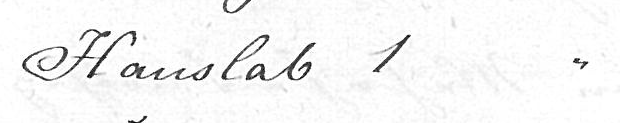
Hauslab 1 "
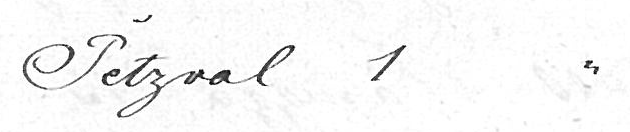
Petzval 1 "
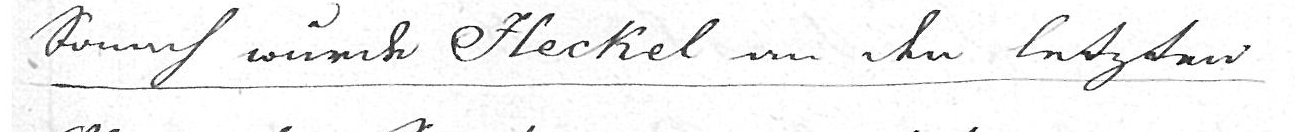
Soanch wurde Heckel an den letzten
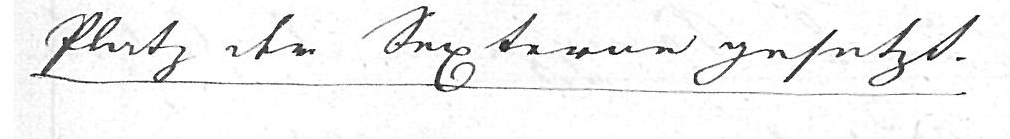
Platz der Sexterne gesetzt.
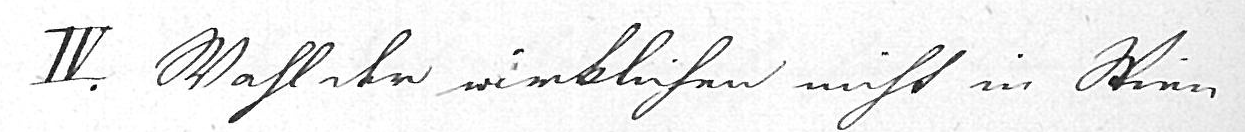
IV. Wahl der wirklichen nicht in Wien
